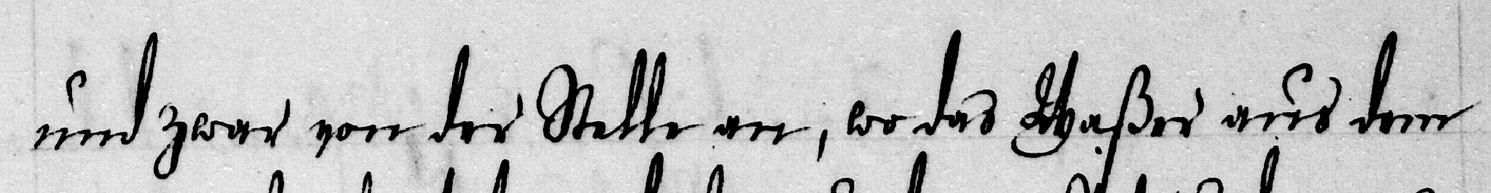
und zwar von der Stelle an, wo das Waßer aus dem
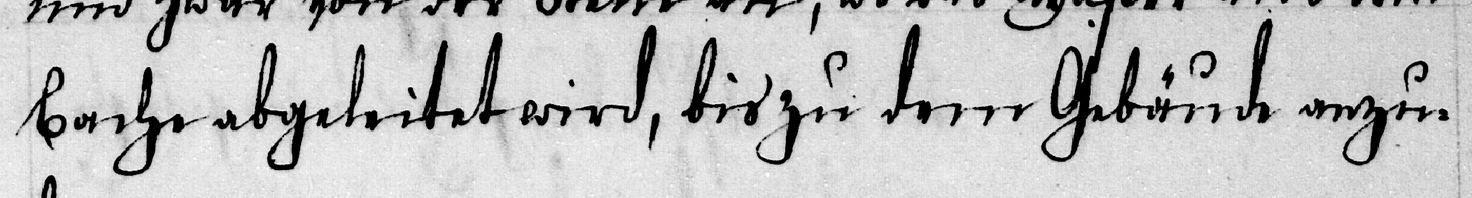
Bache abgeleitet wird, bis zu dem Gebäude anzu¬
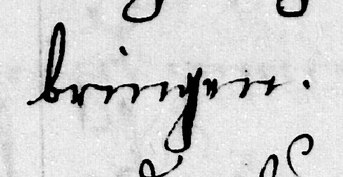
bringen.
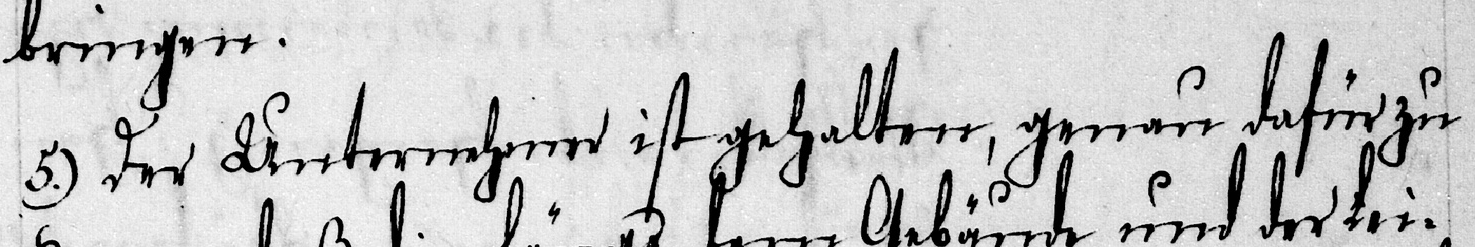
5.) Der Unternehmer ist gehalten, genau dafür zu
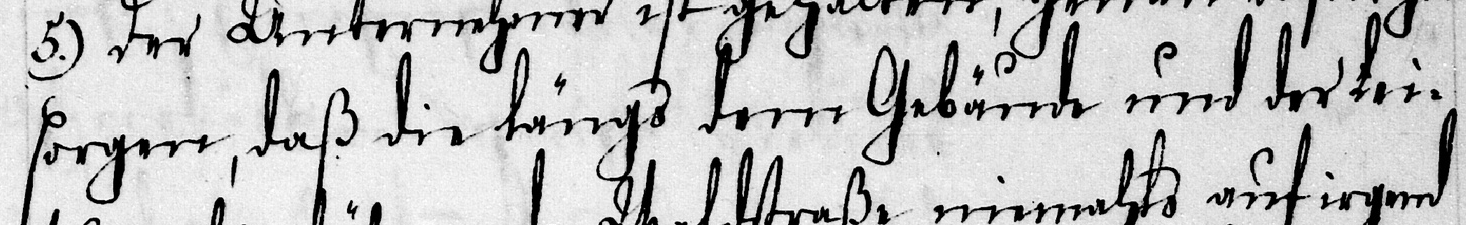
sorgen, daß die längs dem Gebäude und der Lei¬
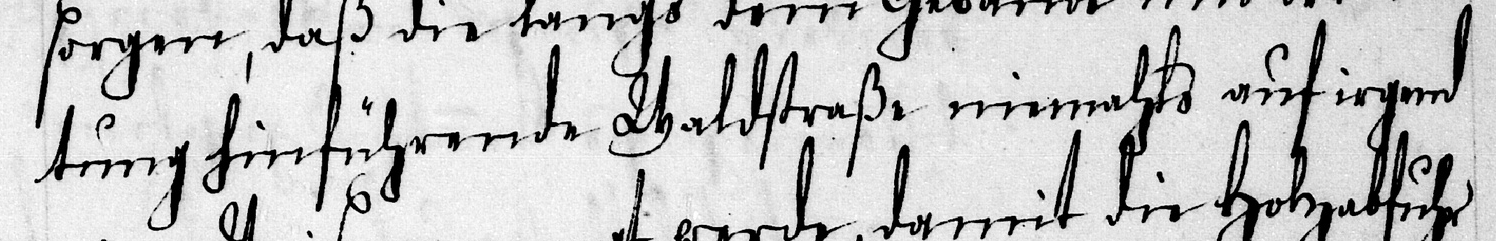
tung hinführende Waldstraße niemahls auf irgend
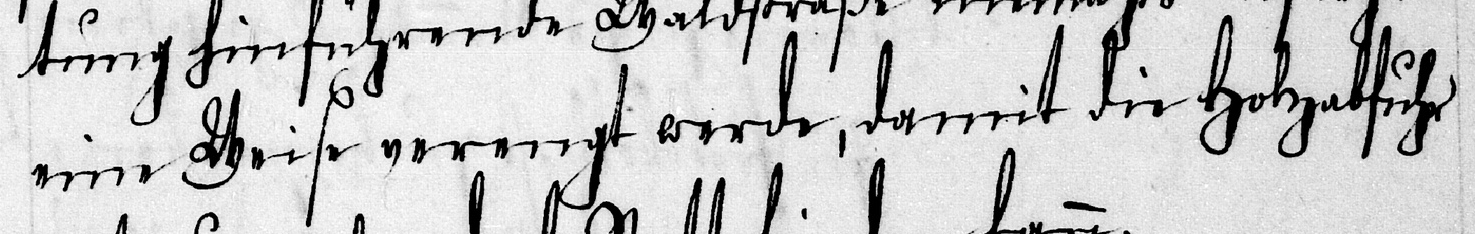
eine Weise verengt werde, damit die Holzabfuhr
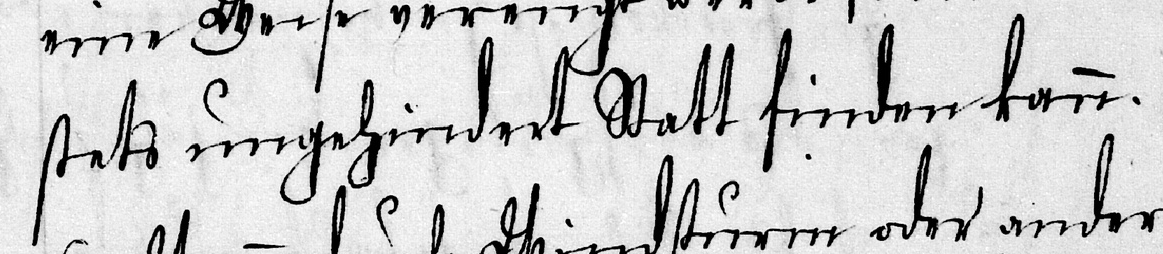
stets ungehindert Statt finden kann.
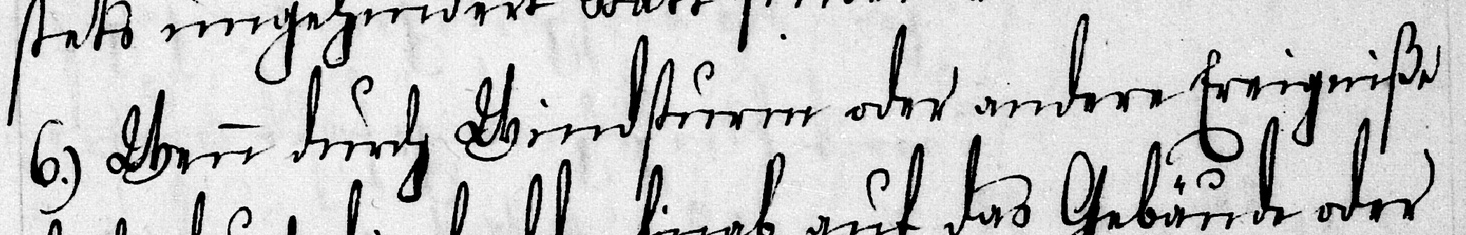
6.) Wenn durch Windsturm oder anderer Ereigniße
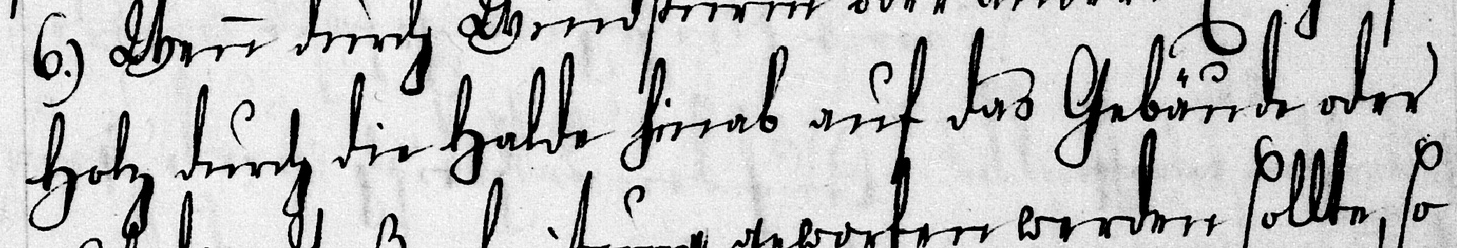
Holz durch die Halde hinab auf das Gebäude oder
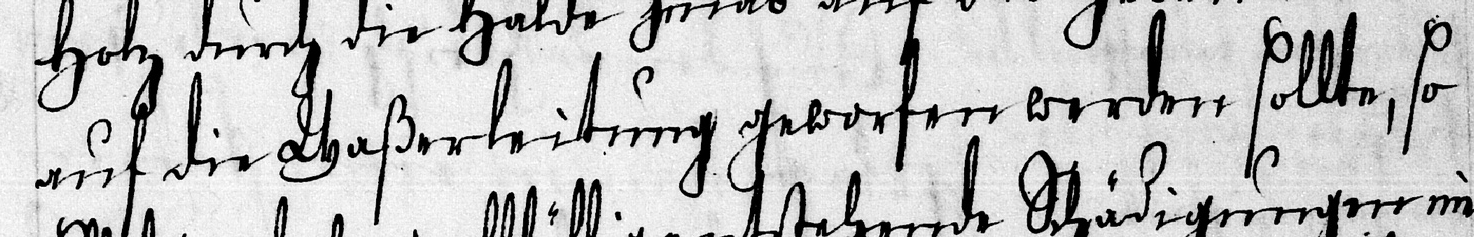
auf die Waßerleitung geworfen werden sollte, so
